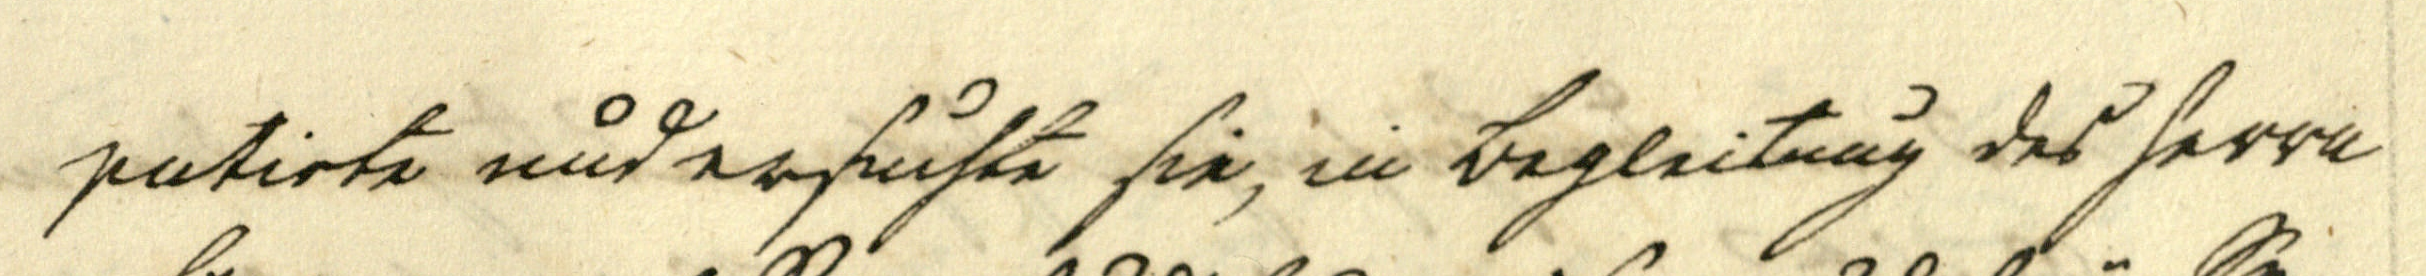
putirte und ersuchte sie, in Begleitung des Herrn
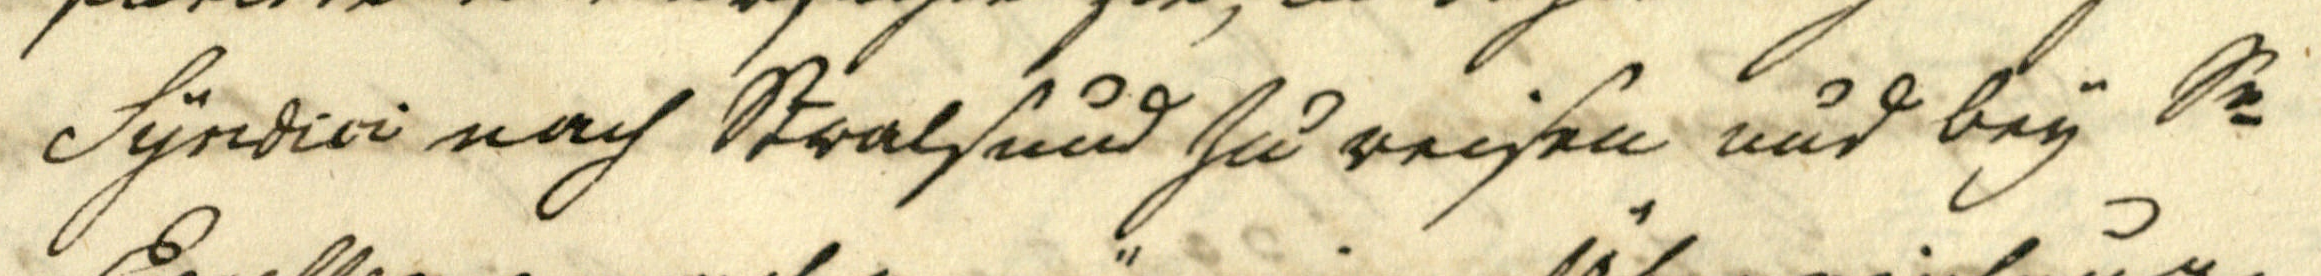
Sÿndici nach Stralsund zu reisen und beÿ Sr
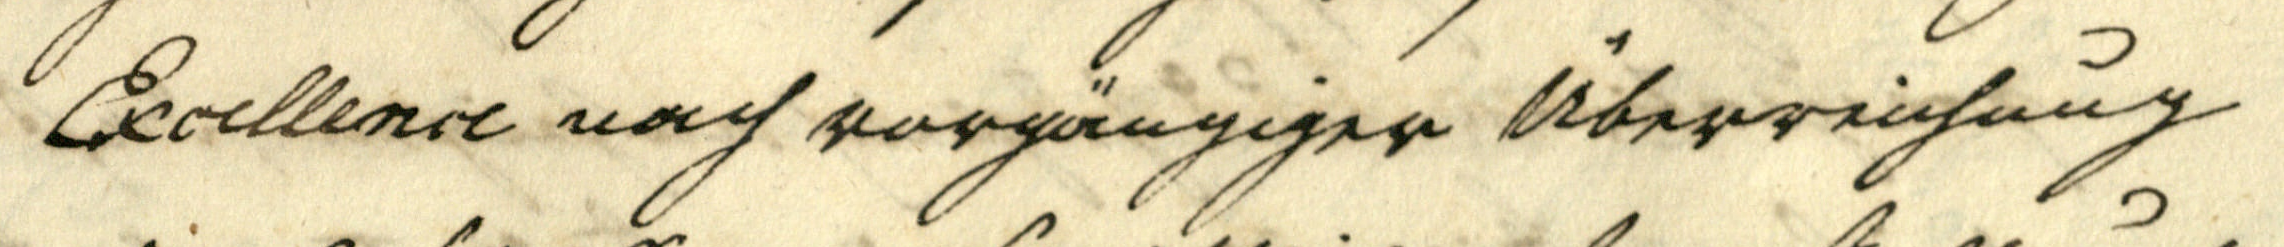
Excellence nach vorgängiger Überreichung
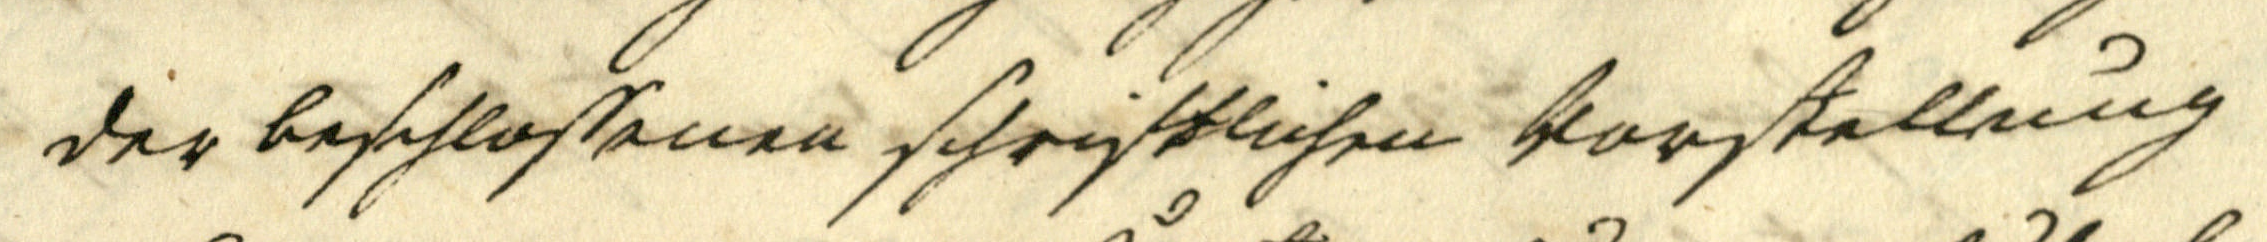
der beschlossenen schriftlichen Vorstellung
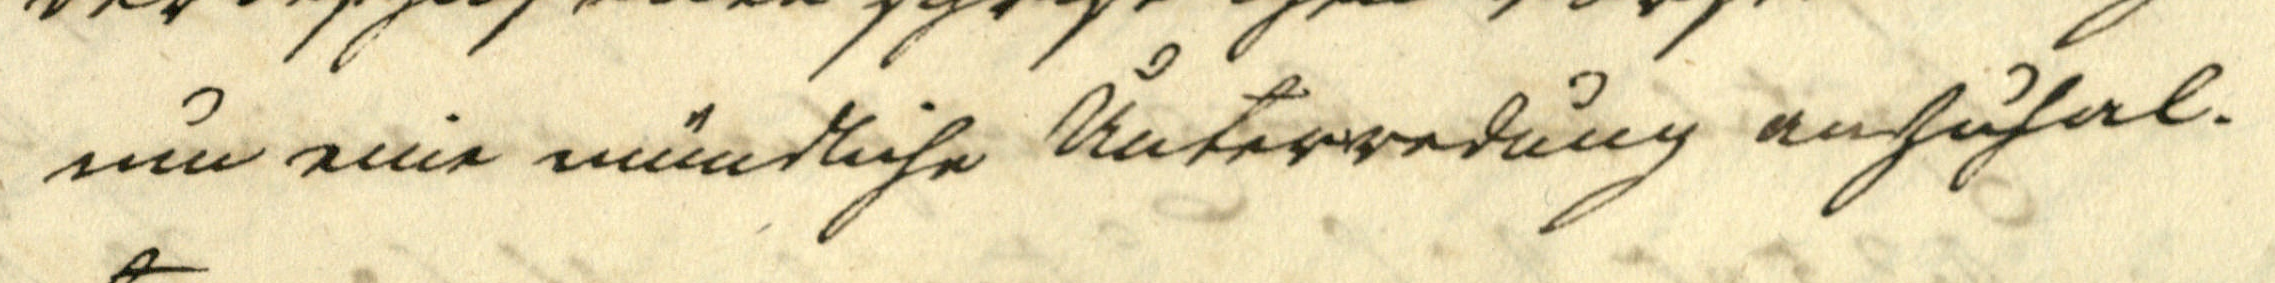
um eine mündliche Unterredung anzuhal¬
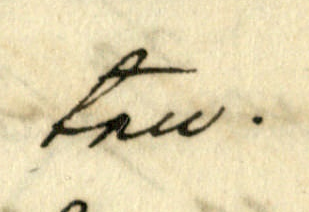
ten.
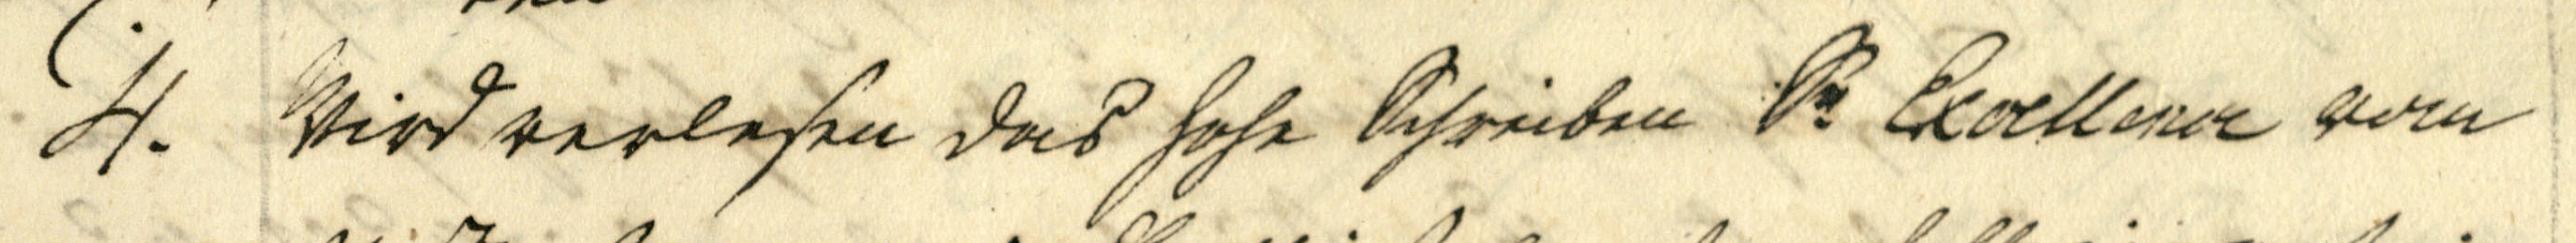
4. Wird verlesen das hohe Schreiben Sr Excellence vom
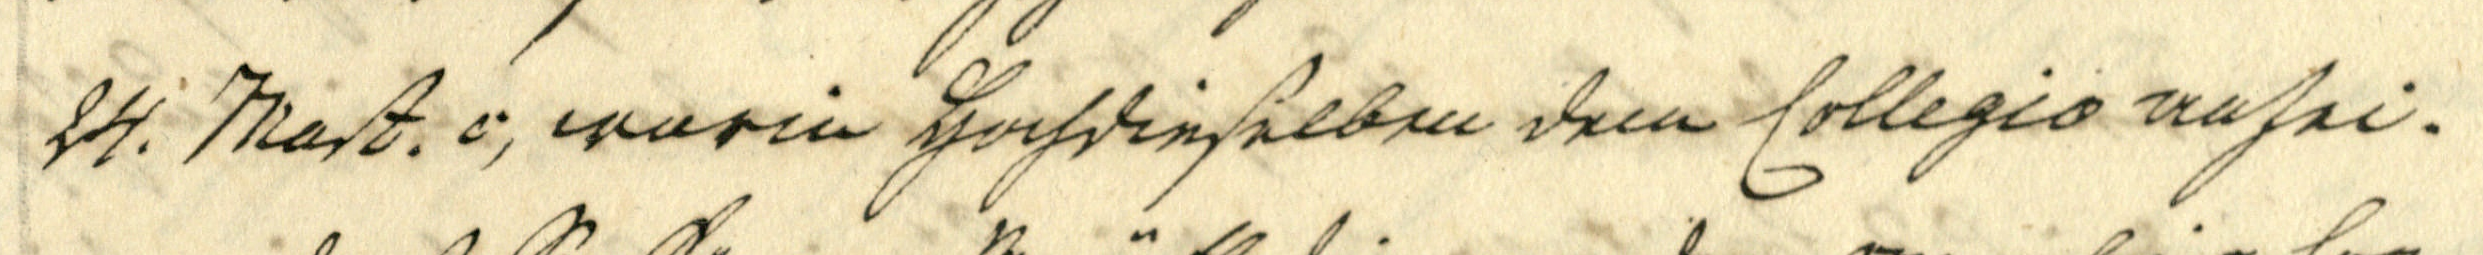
24. Mart. c, worin Hochdieselben dem Collegio anzei¬
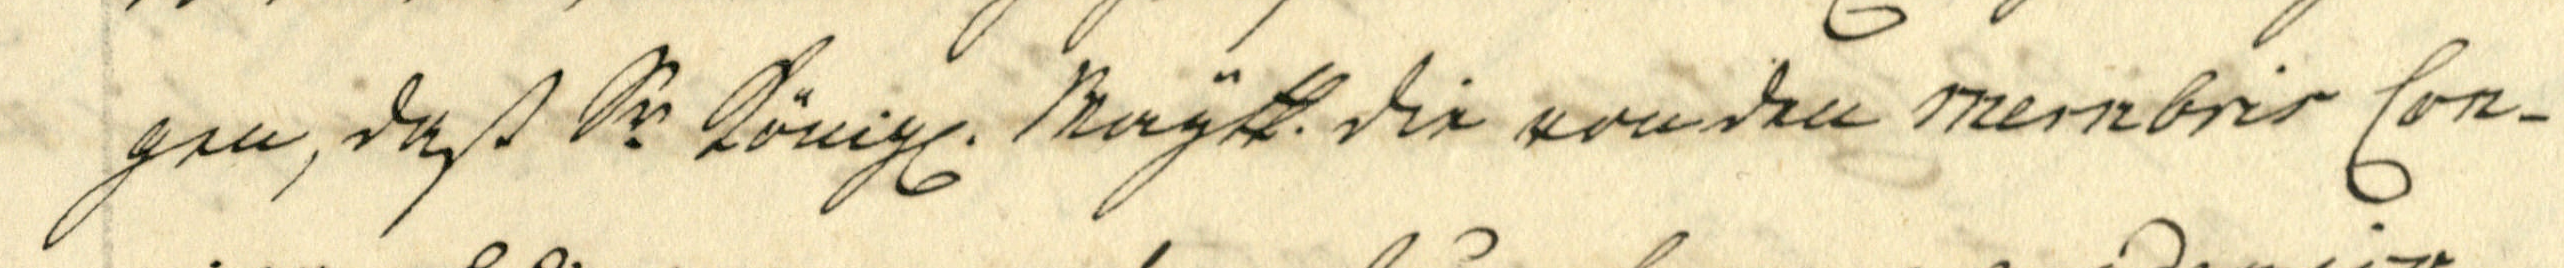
gen, daß Sr Königl. Maÿtt. die von den Membris Con¬
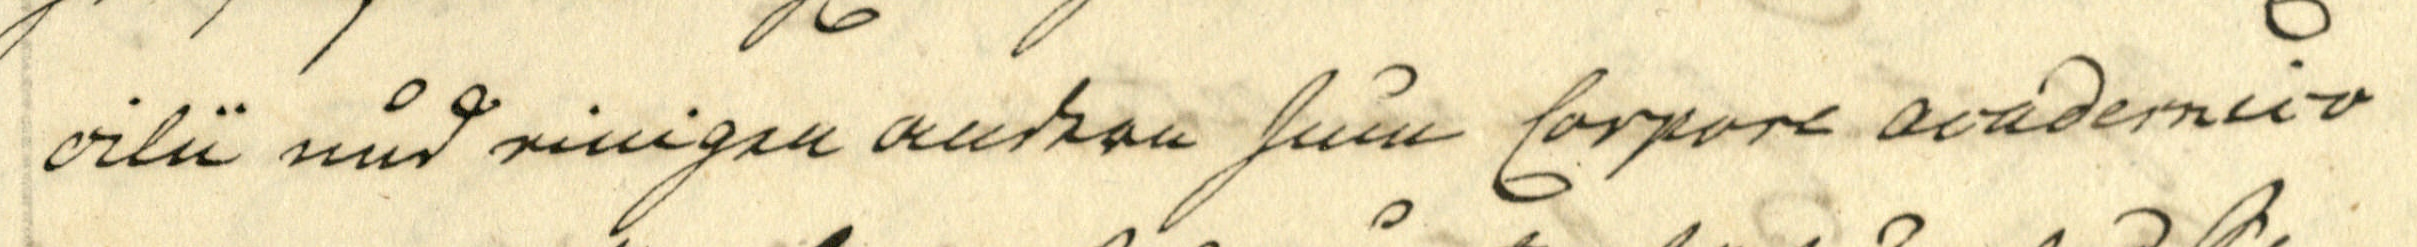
cilii und einigen andern zum Corpore academico
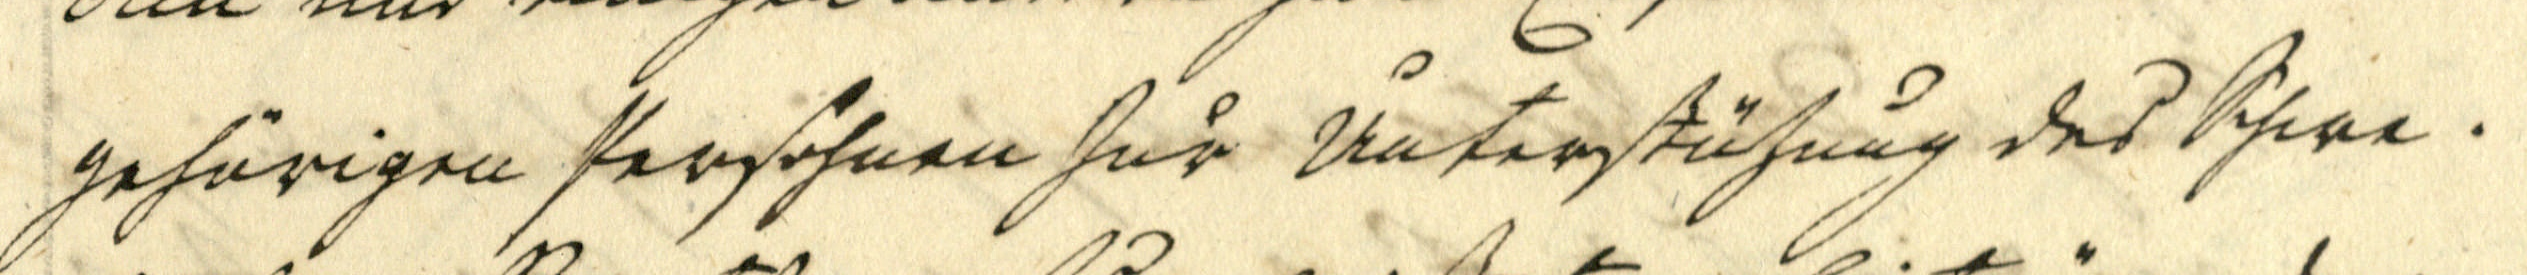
gehörigen Persohnen zur Unterstützung des Schwe¬
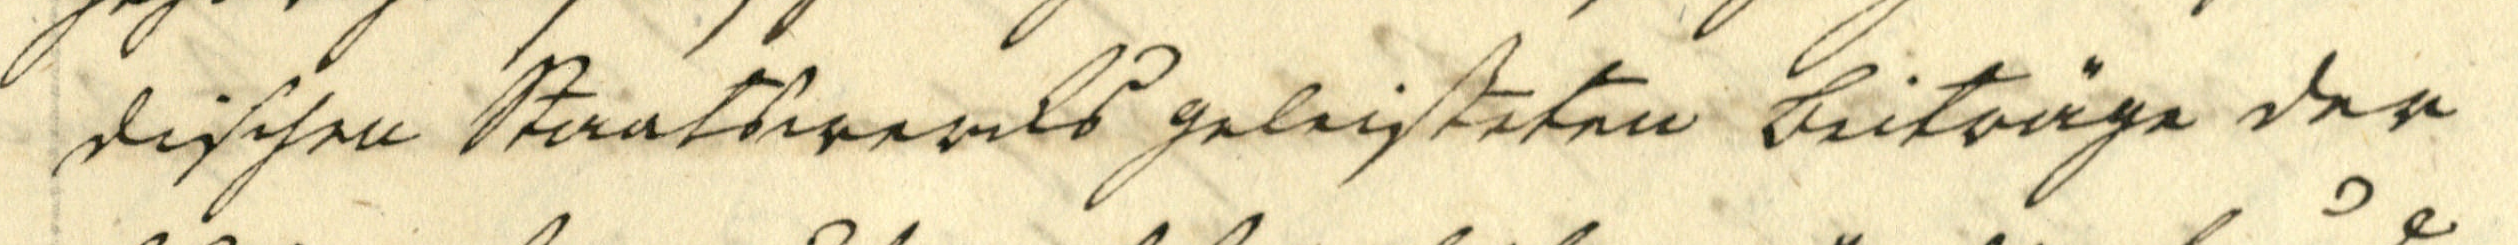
dischen Staatswercks geleisteten Beiträge der
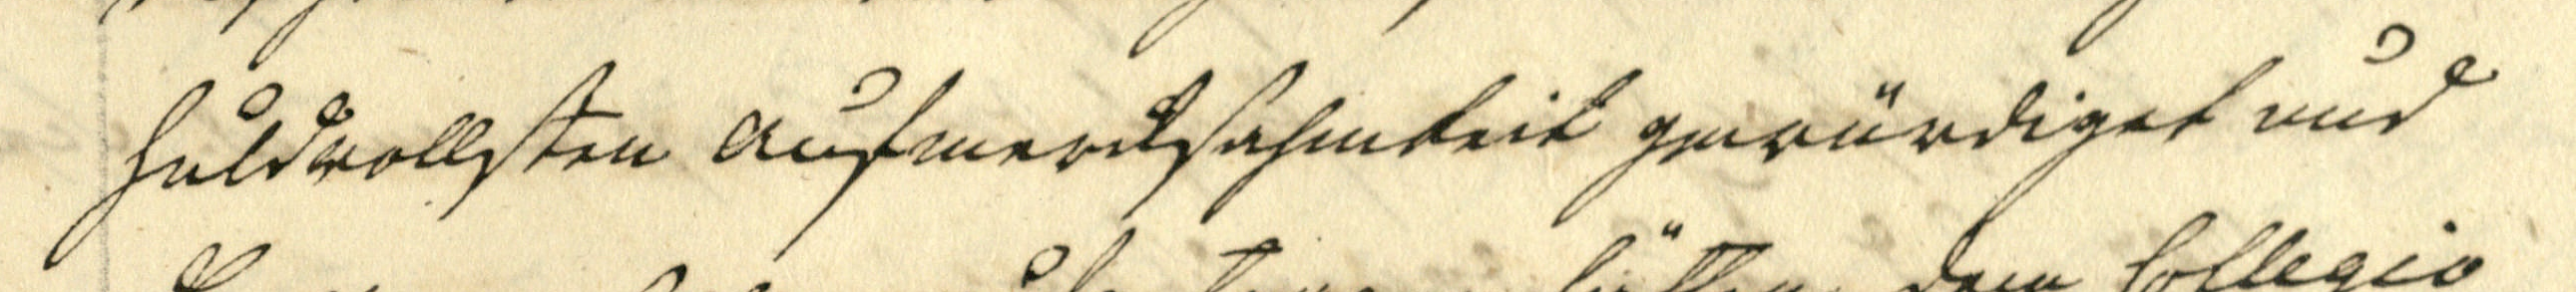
huldvollsten Aufmercksahmkeit gewürdiget und
